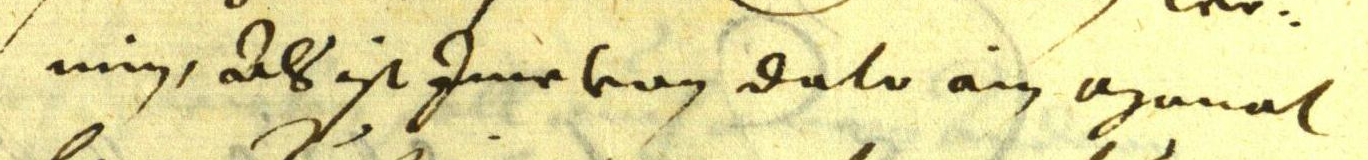min, Als ist Ime von dato ain Monat
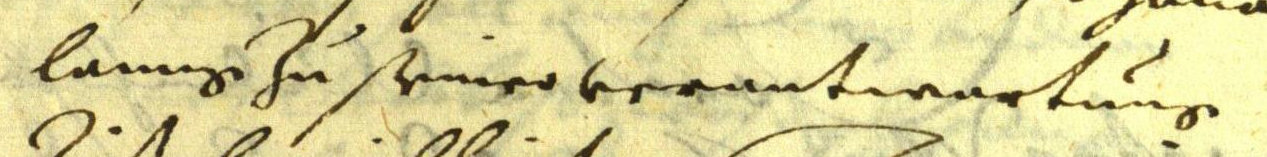lanng Zū seiner verantwortūng
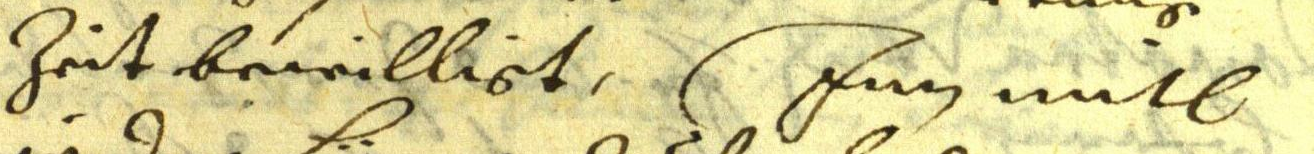Zeit bewilligt, Inn mitl
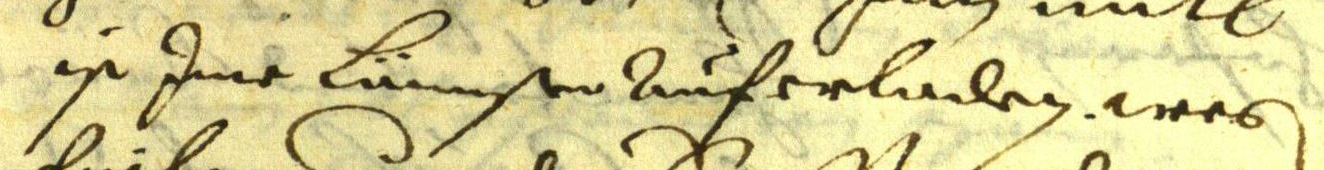ist Ime Lännser Aūferladen. weg
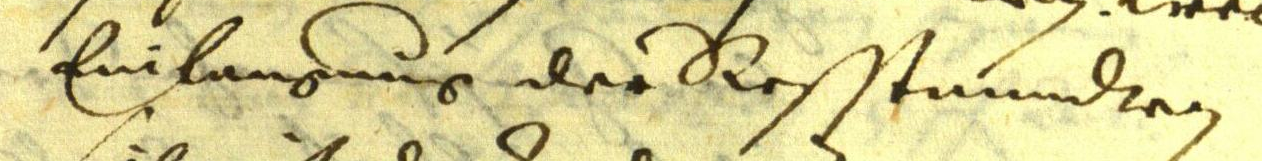Einlangūng der Resstanndten
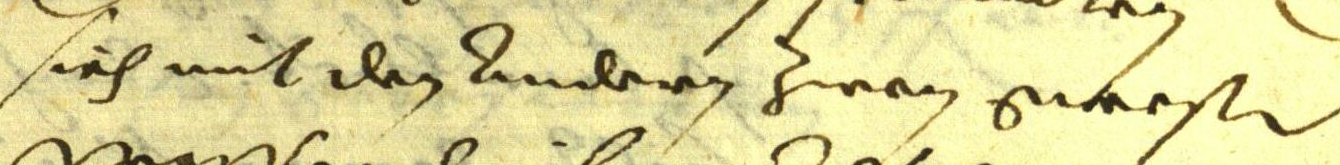sich mit den Andern Zwen gwest
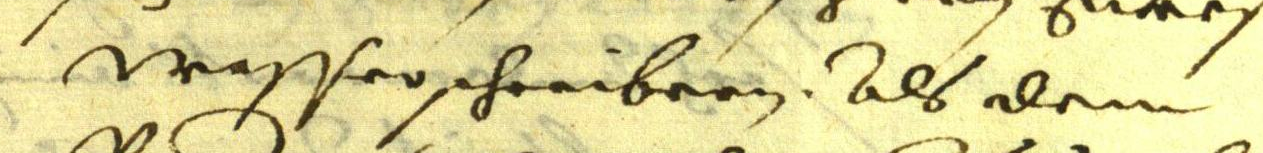Wasserschreibern. Als denn
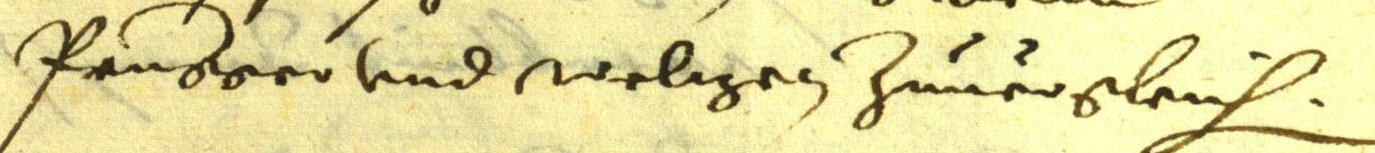Prūgger vnd Welzen Zūuērgleich
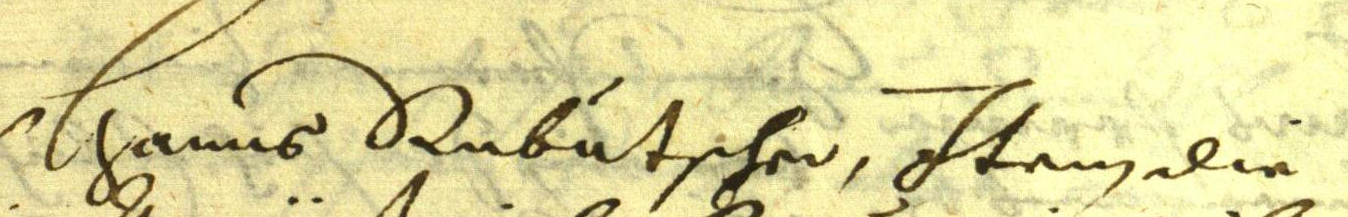Hanns Rubātscher, Item die
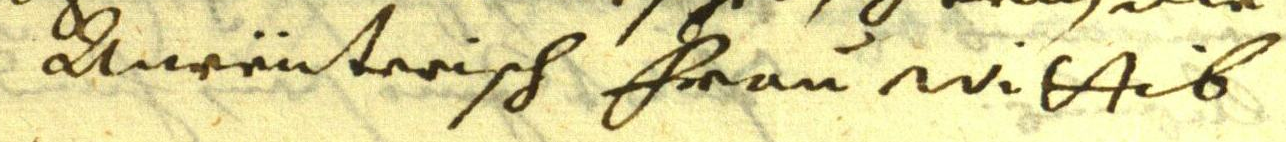Anreüterisch Fraū Wittib
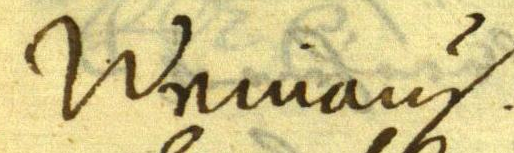Weinaūs¬
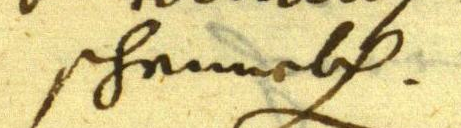schennckh.
